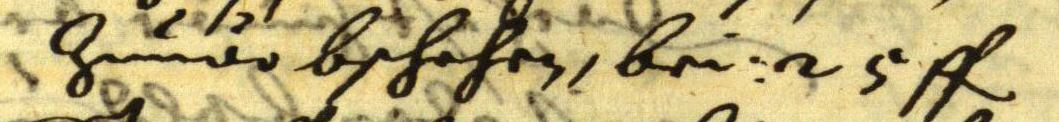Zūūor bschehen, bei: 25 fl
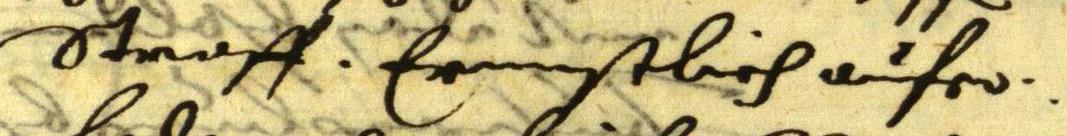Straff. Ernnstlich aūfer¬
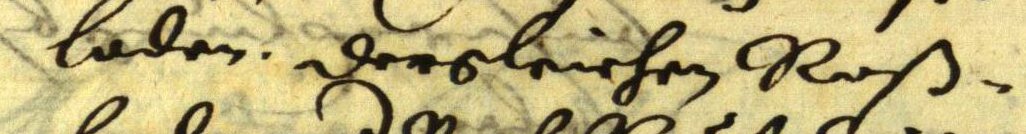laden. dergleichen Roß¬
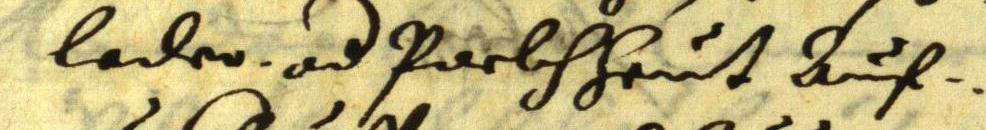leder. od Packhheūt Aūf¬
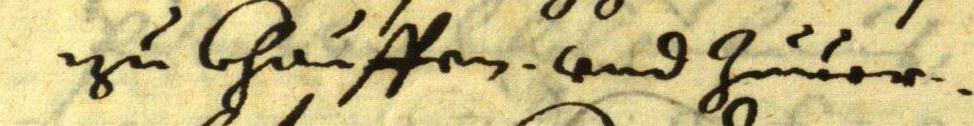zū khaūffen. vnd Zūūer¬
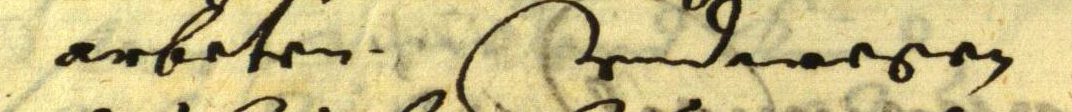arbeten. Vnd wegen
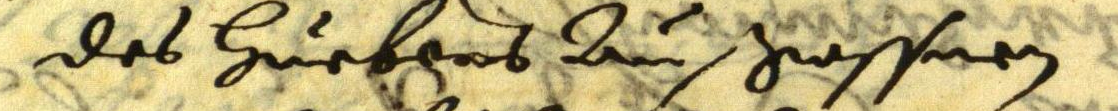des Hūebers Aūsgossnen
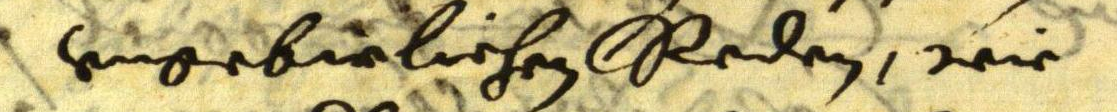vngebirlichen Reden, wie
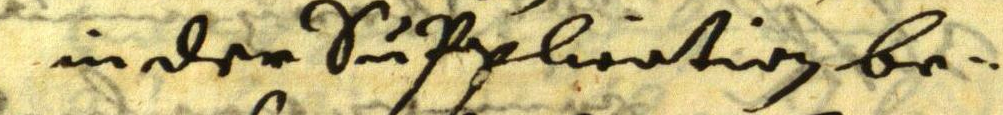in der SūPplication be¬
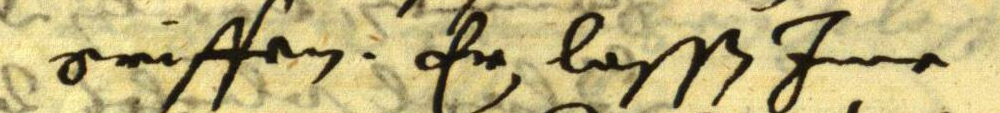griffen. Er lasß Ime
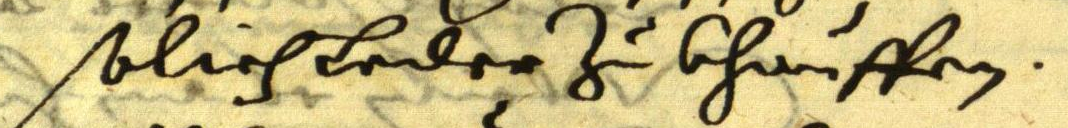solich Leder Zū khaūffen.
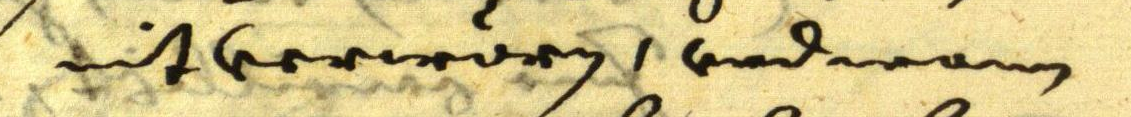nit verwörn, vnd wann
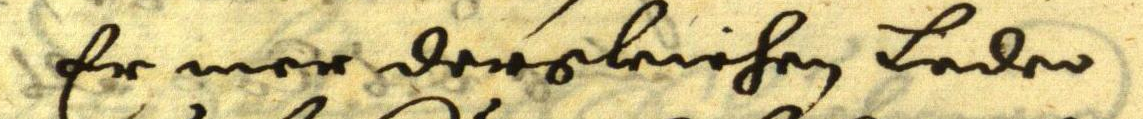Er mer dergleichen Leder
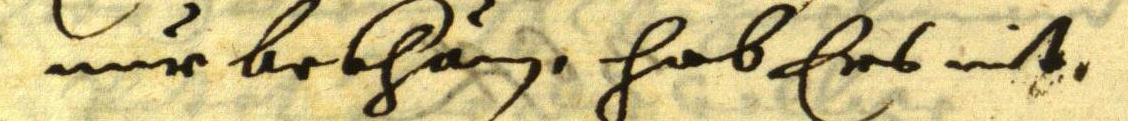nūr bekhām, hab Ers nit.
